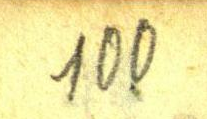100
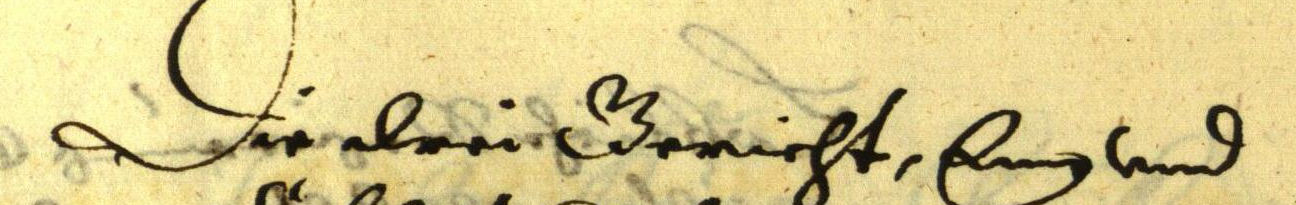Die drei Gericht, Enn vnd
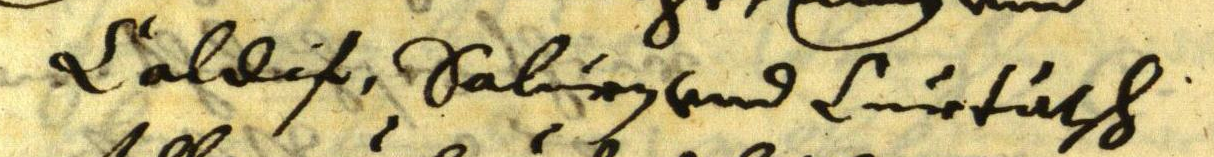Caldif, Salūrn vnd Cūrtātsch
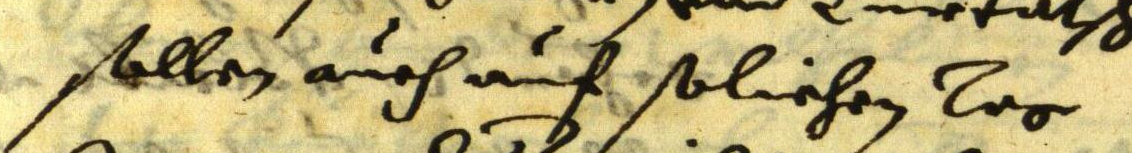sollen aūch aūf solichen Tag
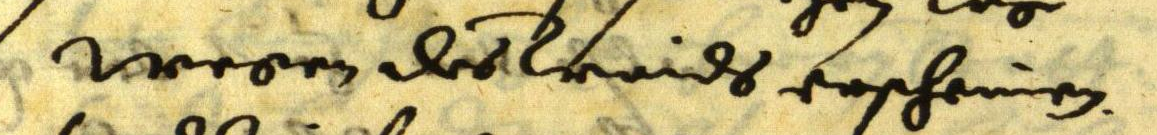wegen des Traids erscheinen.
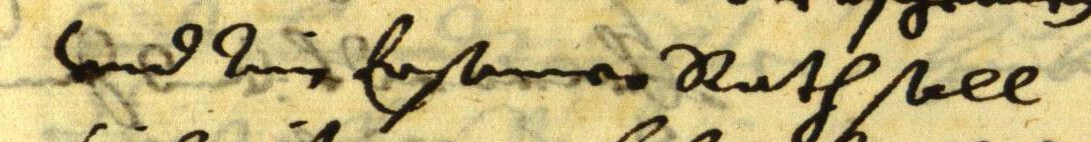vnd Aim Ersamen Rath soll
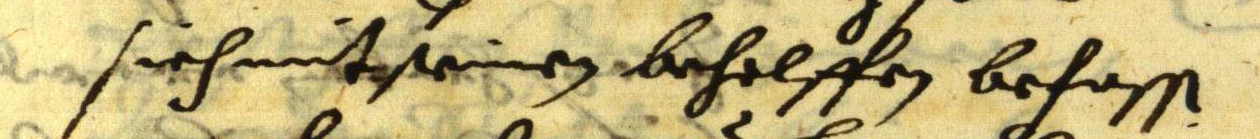sich mit seinen behelffen befasst
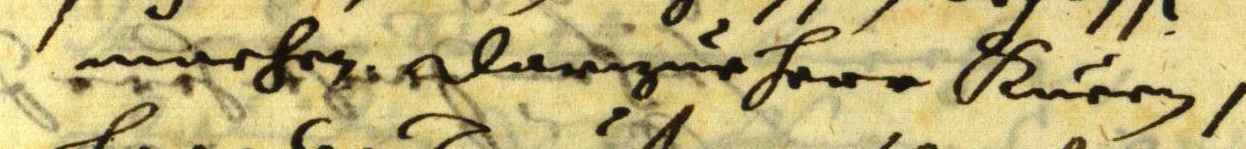machen. darzūe herr Kūeen,
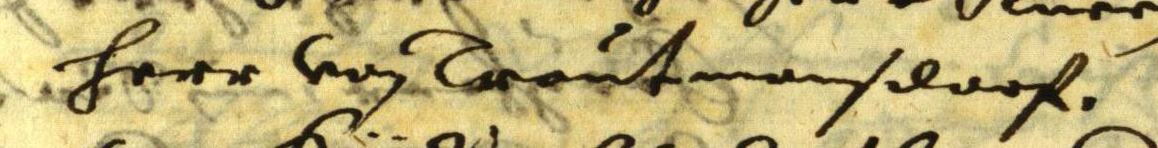herr von Traūtmansdorf.
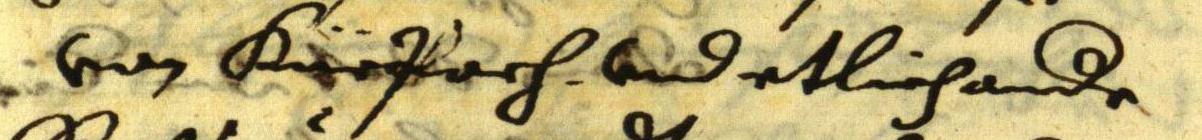von KüePach. vnd etlich ande
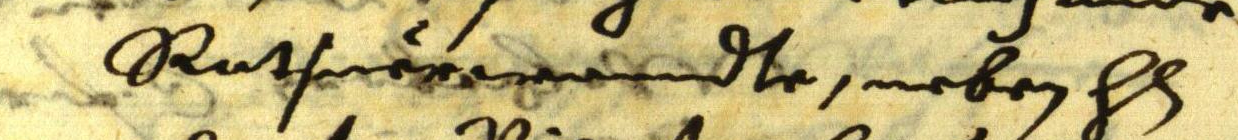Ratsūerwanndte, neben hln
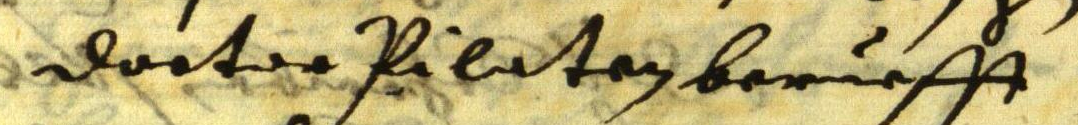doctor Pilaten berūefft
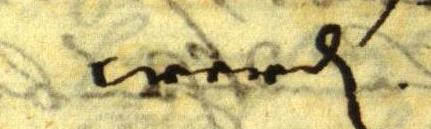werd.
